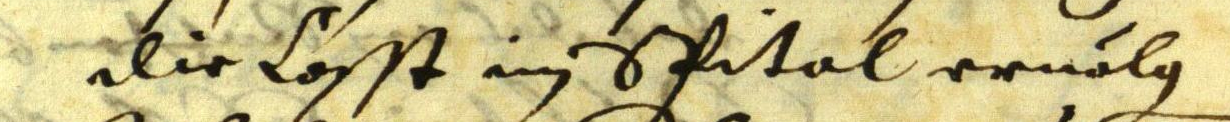die Cosst im SPital erūolg
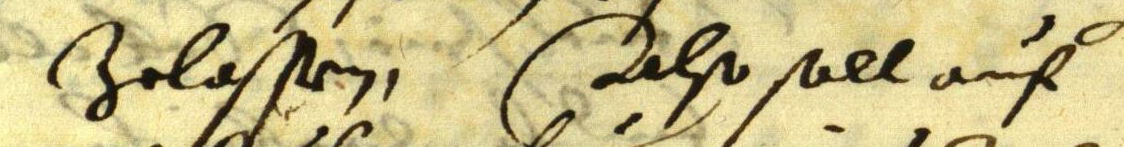Zelassen, Also soll aūf
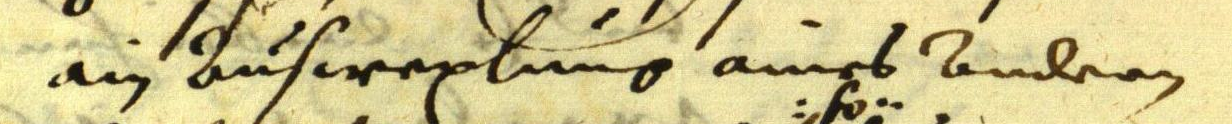ain Aūswexlūng aines Andren
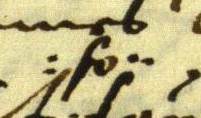:so:
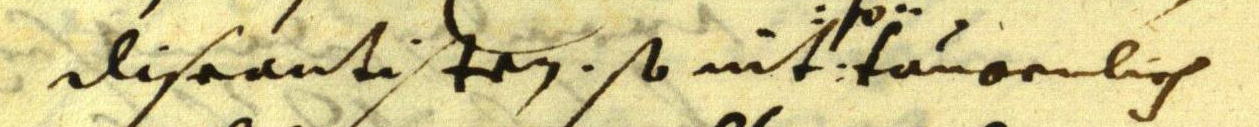discantisten. so nit : taūgenlich
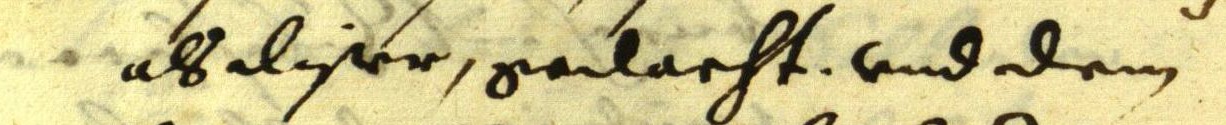als diser, gedacht. vnd dem
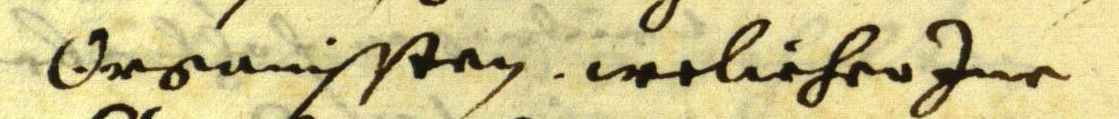Organissten. welicher Ine
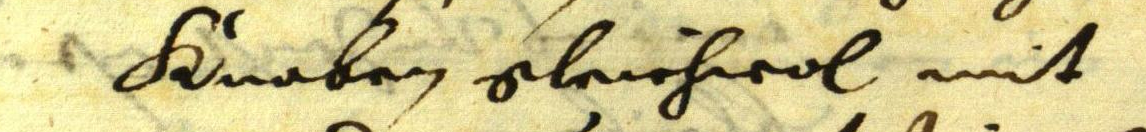Knaben gleichwol mit
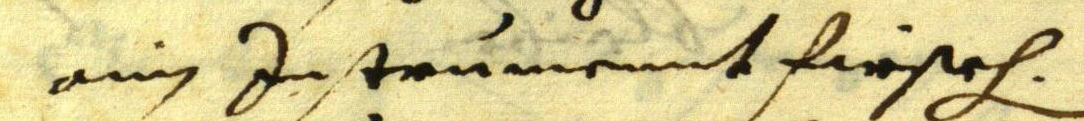ain Instrūment firseh
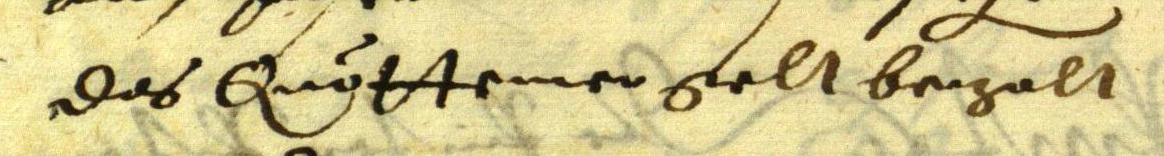das Qūattemer gelt bezalt
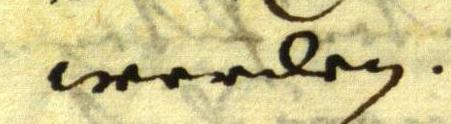werden.
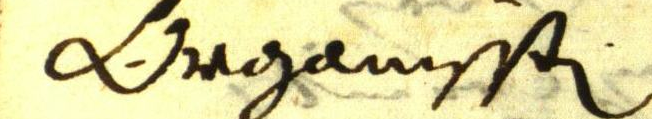Organisst.
